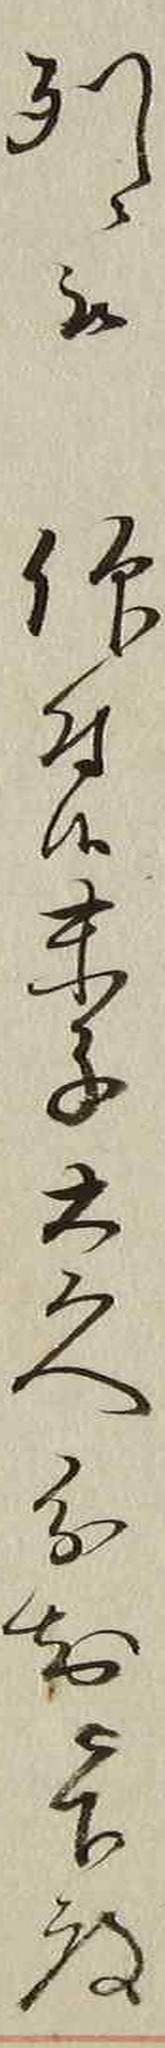列に被仰付候末子大久分知被下度
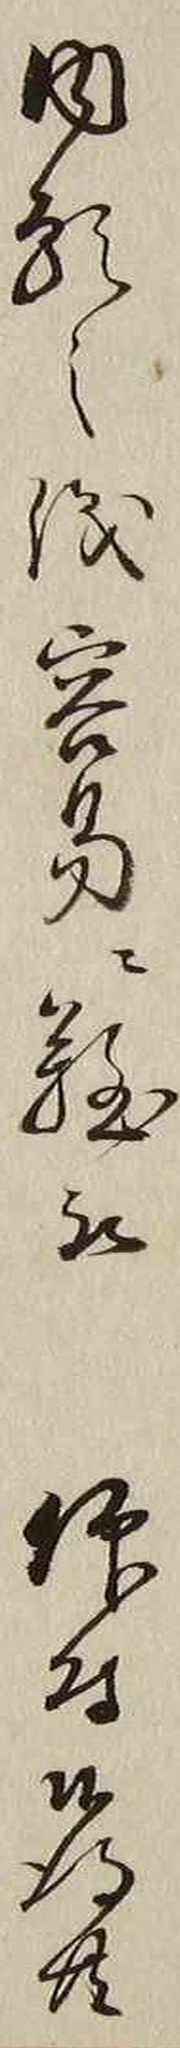内願之儀容易に難被仰付候得共
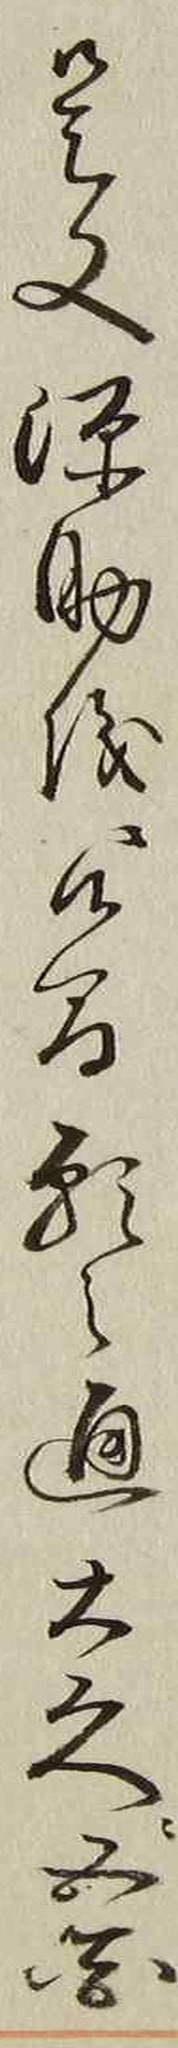且又源助儀に候間願之通大久に五百
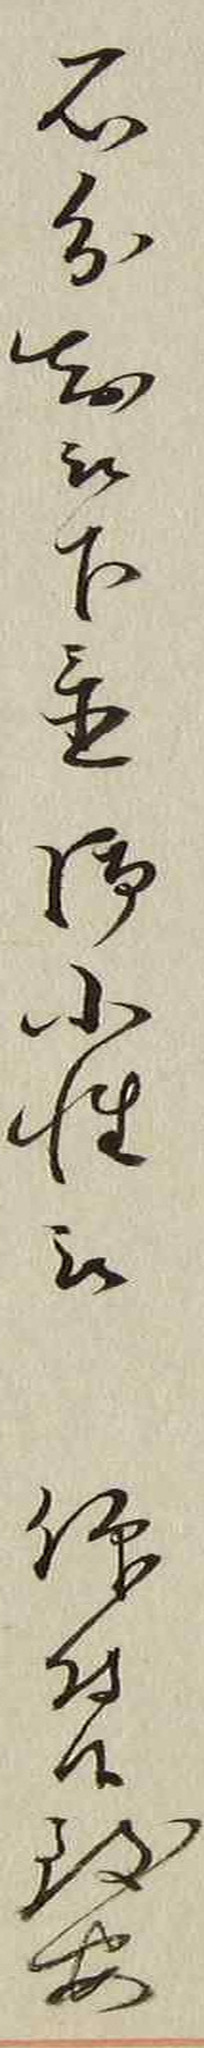石分知被下置御小姓被仰付候致安
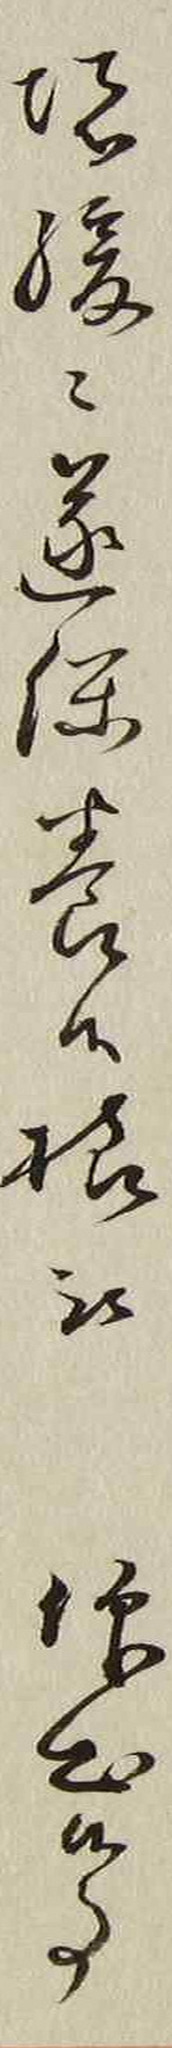堵緩々遂保養候様被仰出候事
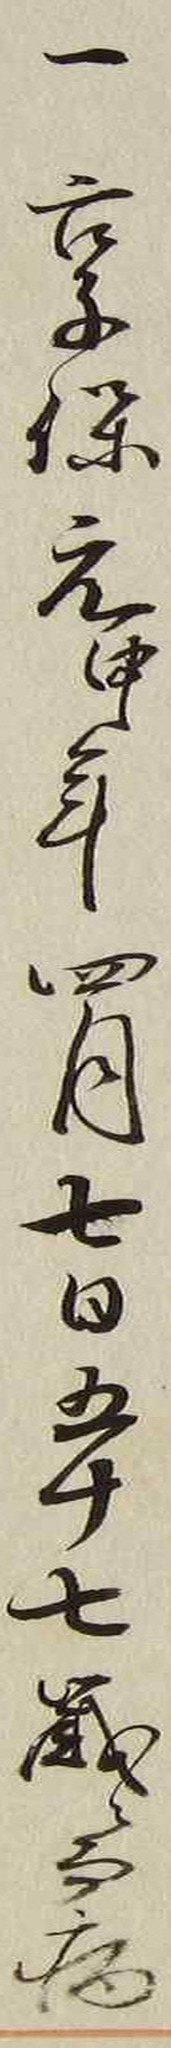一享保元申年四月七日五十七歳ニ而病
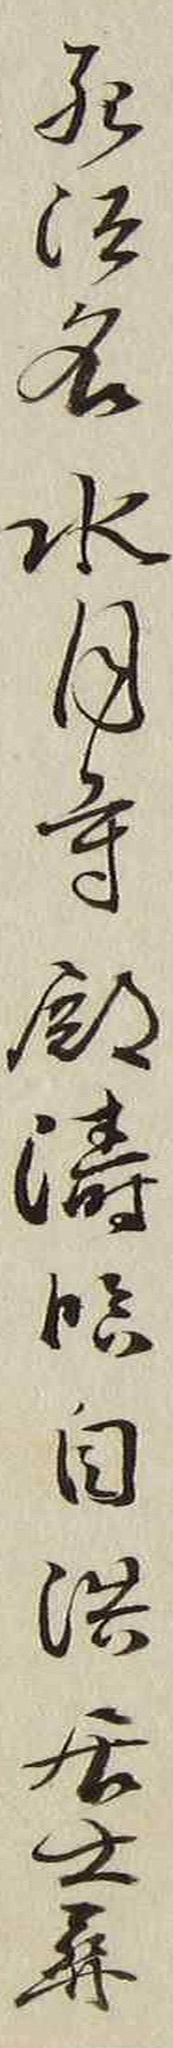死法名水月寺殿濤臨自洪居士葬
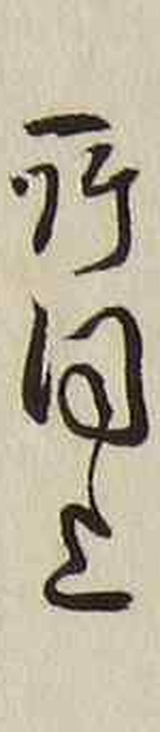所同上

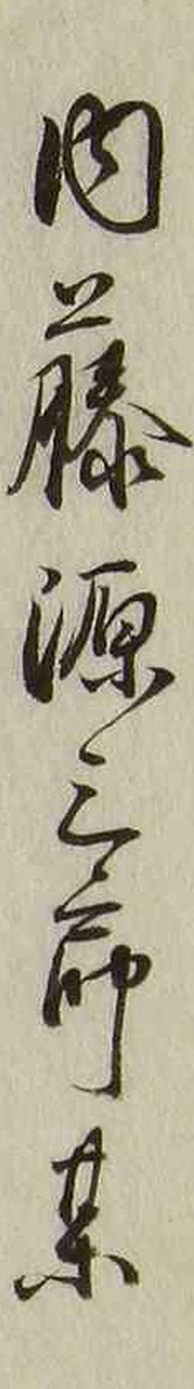内藤源三郎某
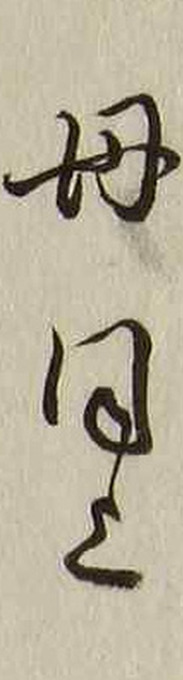母同上
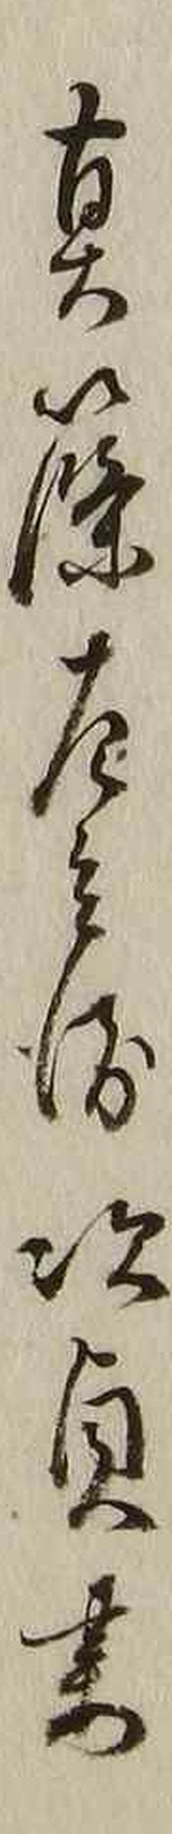女真篠左兵衛次貞妻
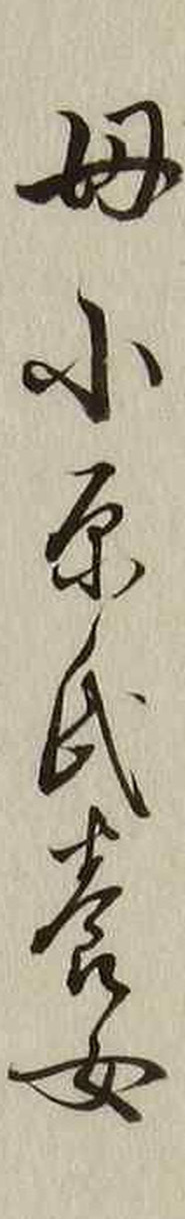母小原氏養女
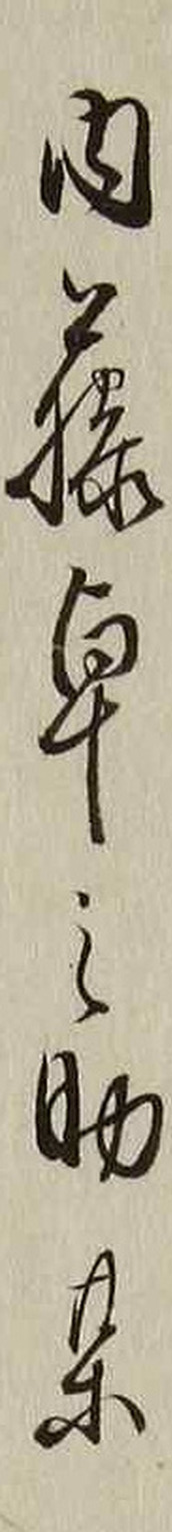内藤卓之助某
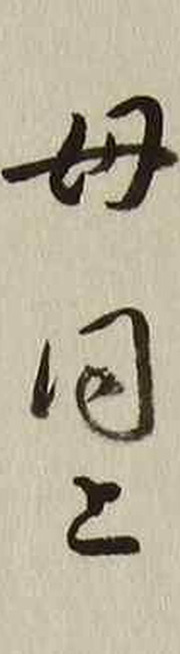母同上
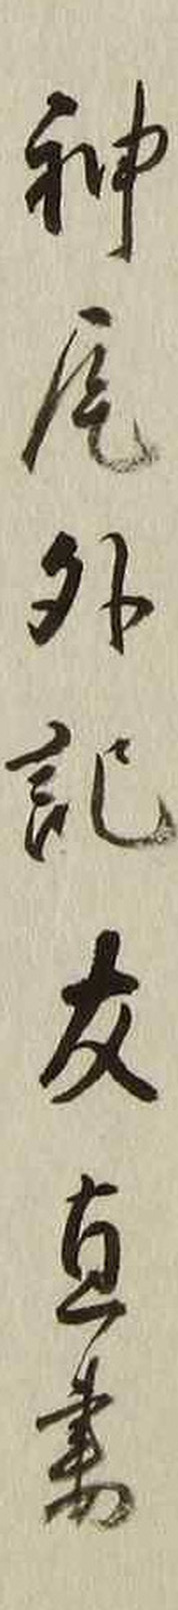女神尾外記友直妻
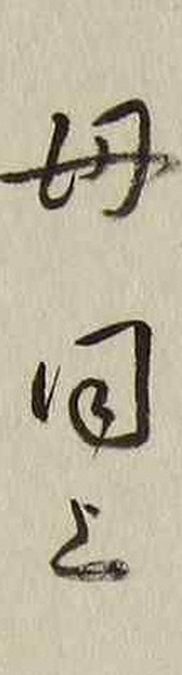母同上
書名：諸士系譜　巻之159　な之部1
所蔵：会津若松市立会津図書館
